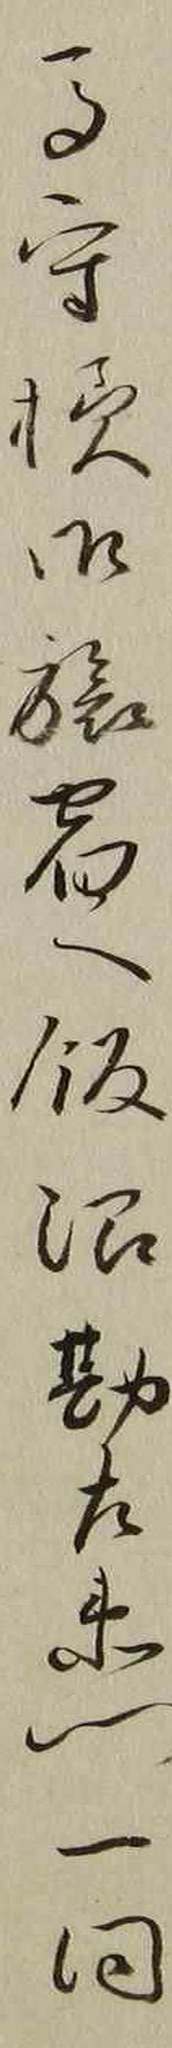馬守様御旅宿へ飯沼勘左衛門一同
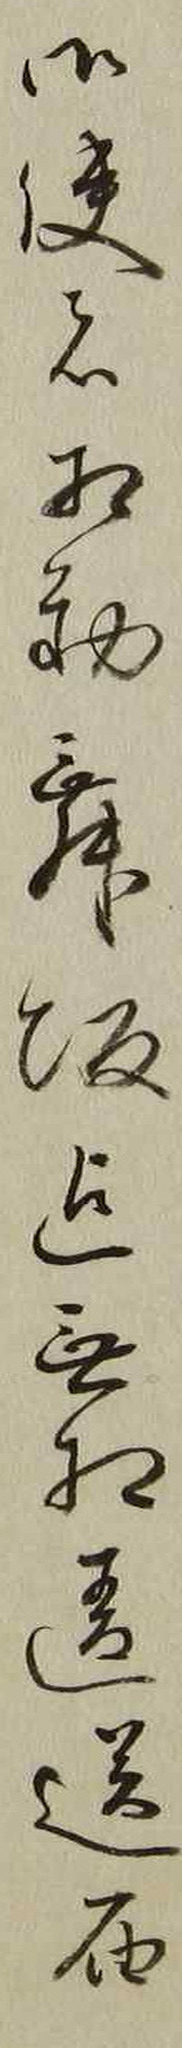御使者相勤舞坂迄無相違送届
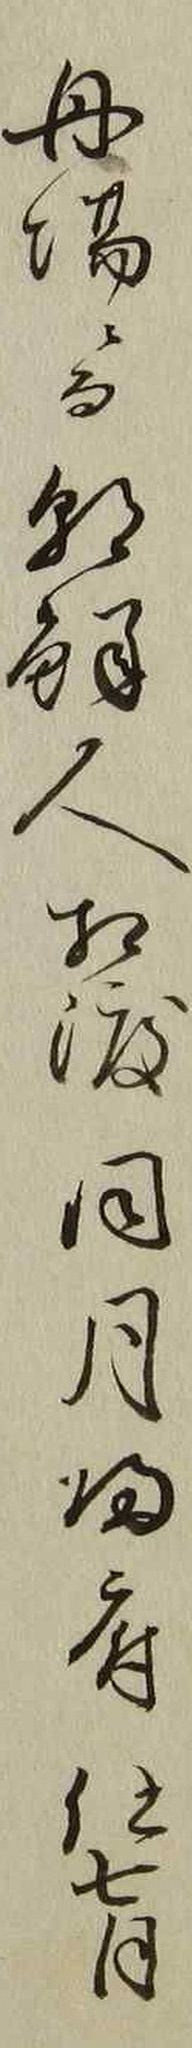舟場ニ而朝鮮人相渡同月帰府仕七月
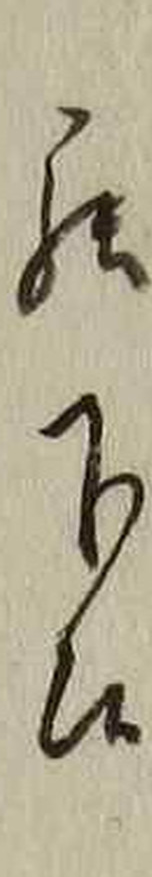罷下候
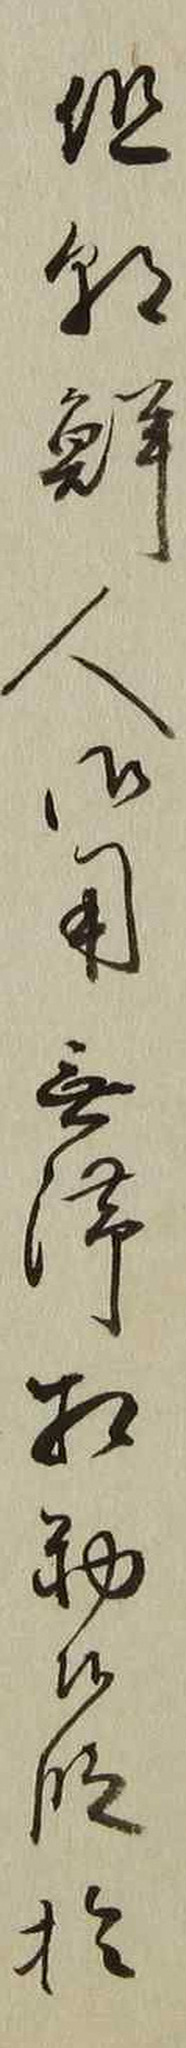但朝鮮人御用無滞相勤候段於
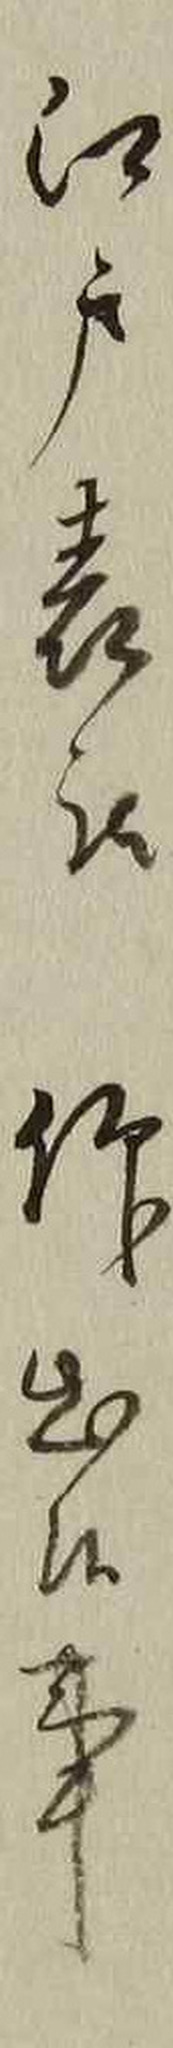江戸表被仰出候事
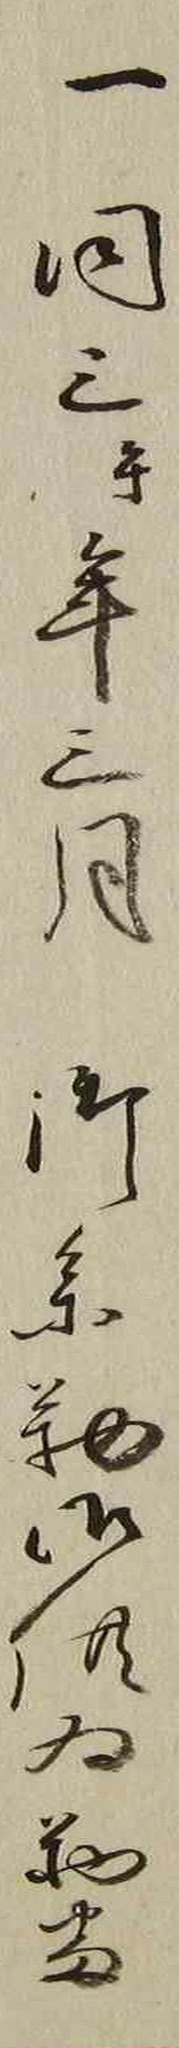一同三午年三月御参勤御供為勤番
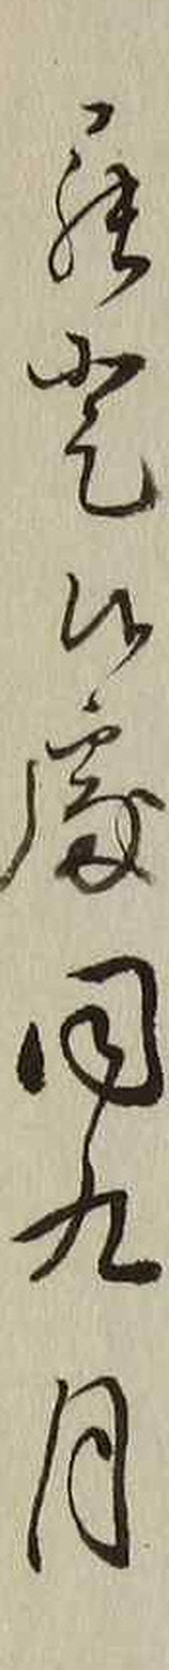罷登候処同九月
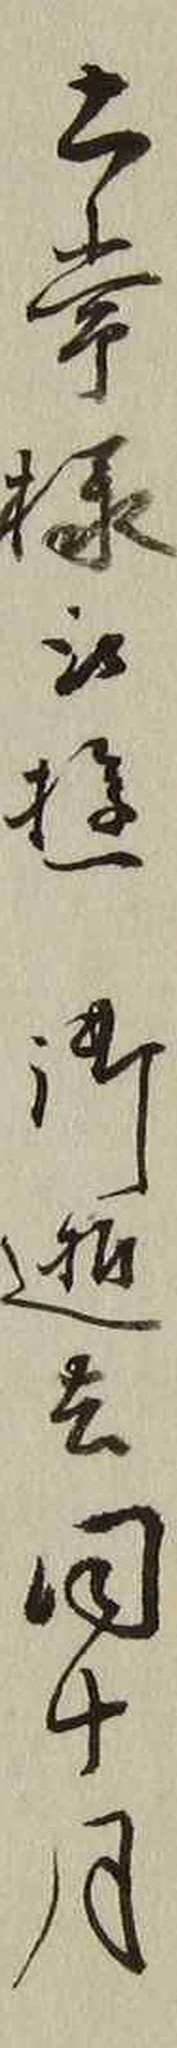土常様被遊御逝去同十月
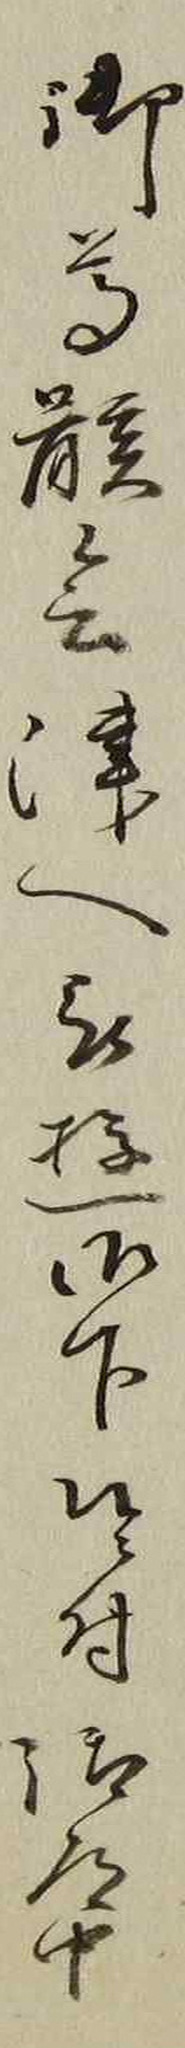御尊骸会津へ被遊御下候ニ付御道中
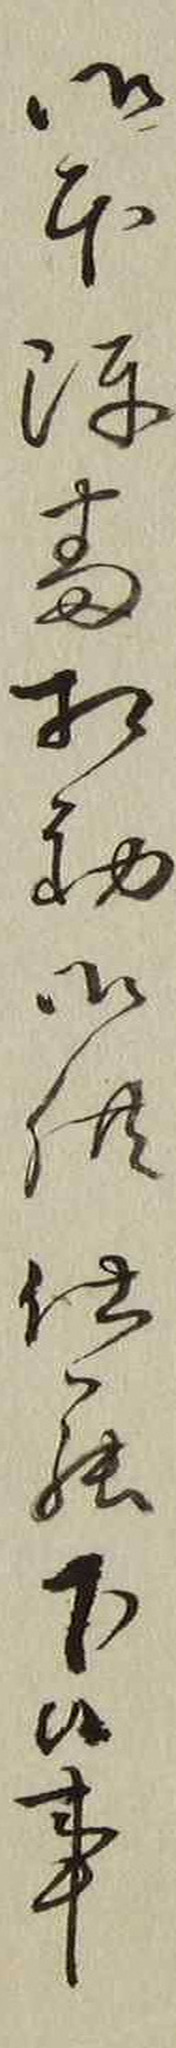御本陣番相勤御供仕罷下候事
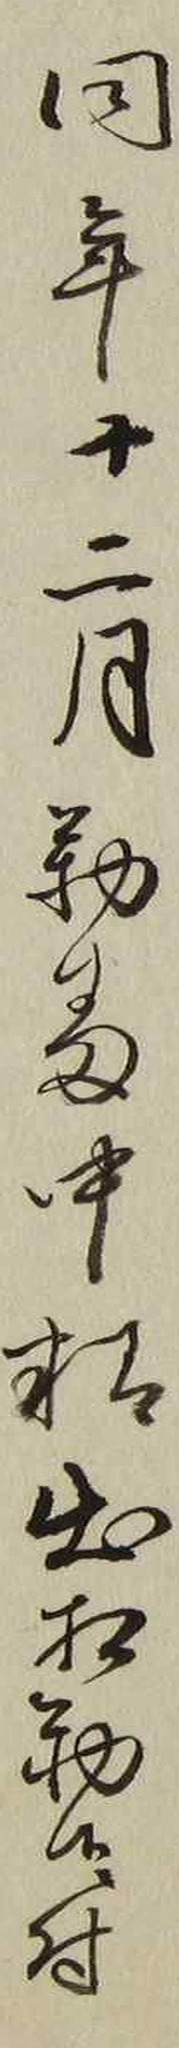同年十二月勤番中精出相勤候ニ付
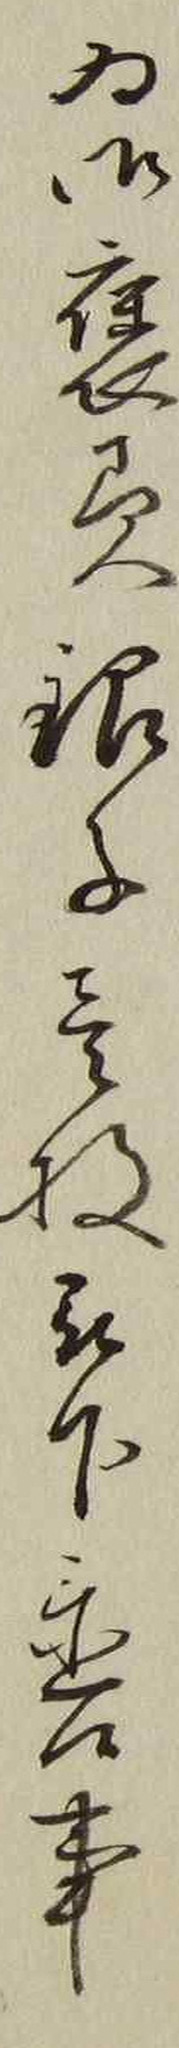為御褒美銀子壱枚被下置候事
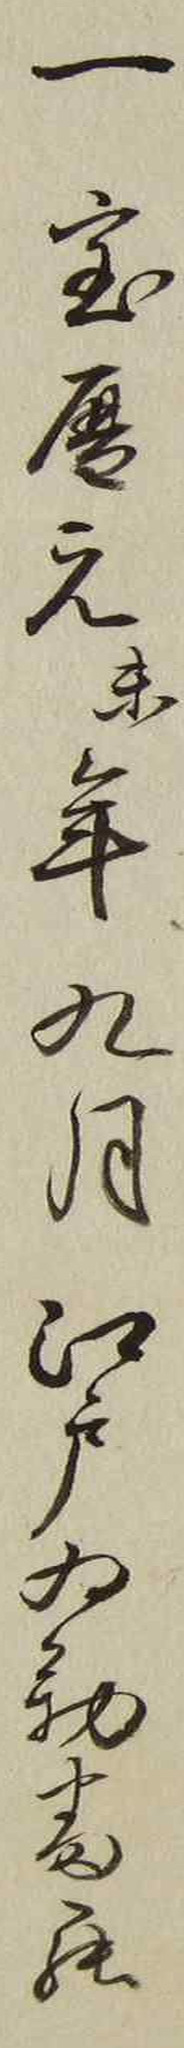一宝暦元未年九月江戸為勤番罷

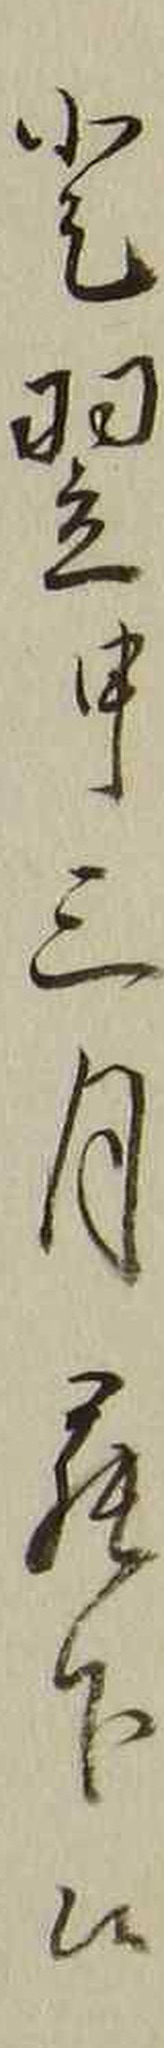登翌申三月罷下候
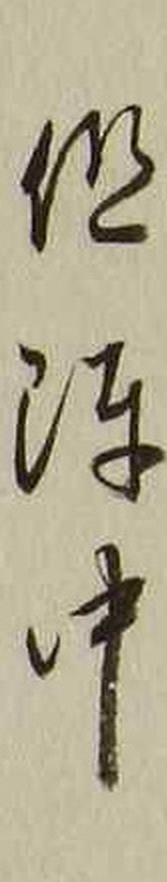但陣中
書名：諸士系譜　巻之3　い之部3
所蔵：会津若松市立会津図書館
